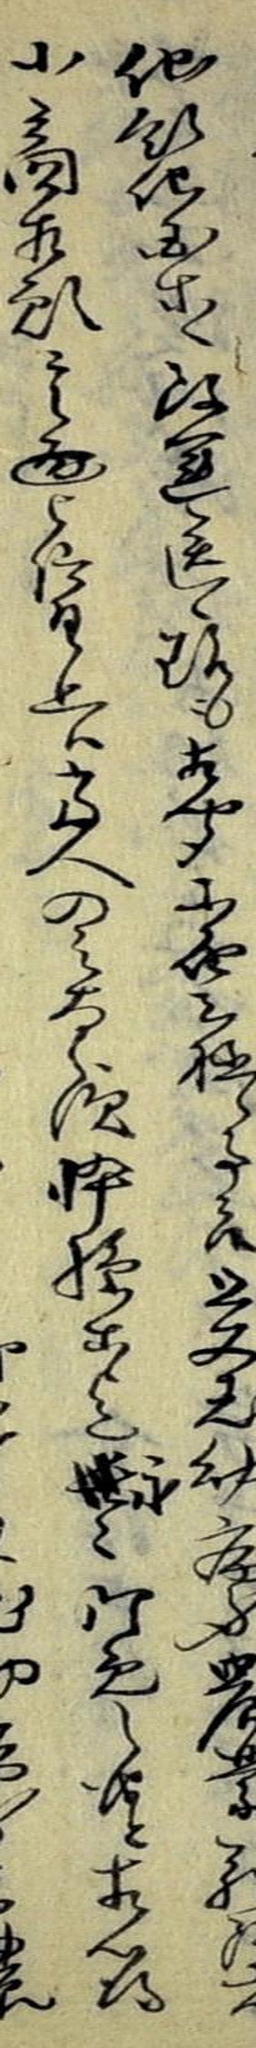小商相願々之通被仰付候上は当人のみならす忰孫等迄々御免之儀と相心得
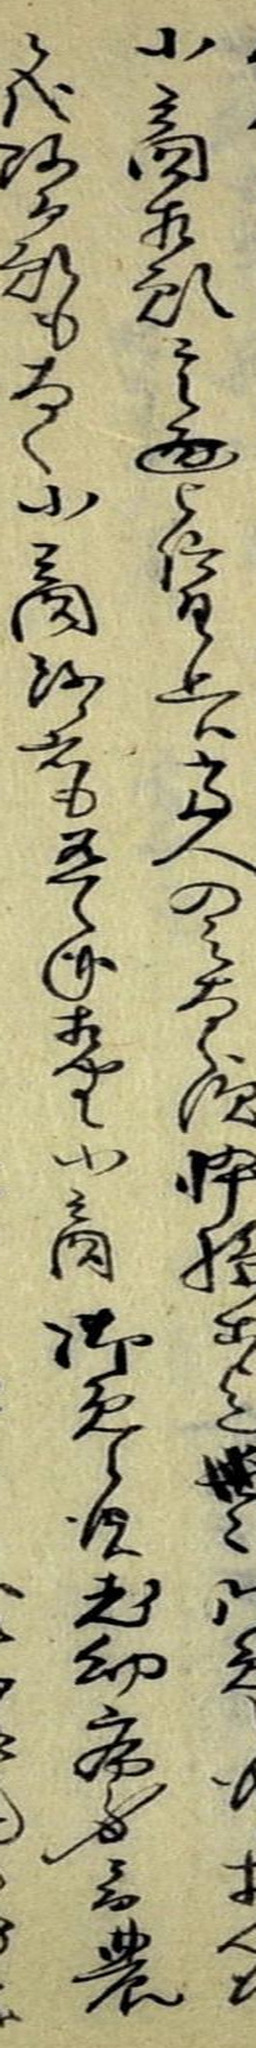候哉改而願もなく小商致候者も有之趣相聞候小商御免之儀は老幼病身に而農
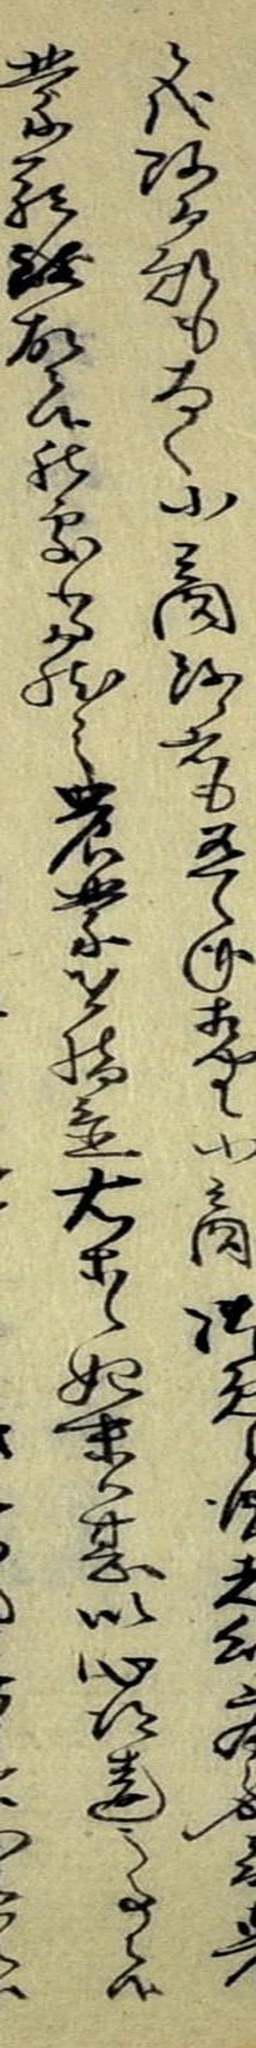業難致故に候然処当然之農業を指置右等之始末は甚以心得違之事に候
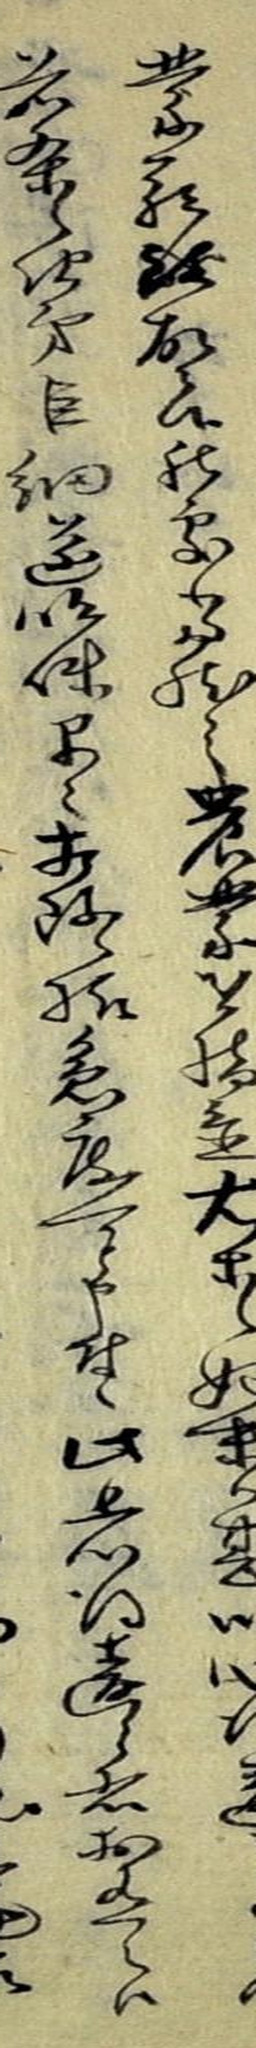前條之次第巨細遂吟味早々相改候様急度可被申付候此上心得違之者於有之は
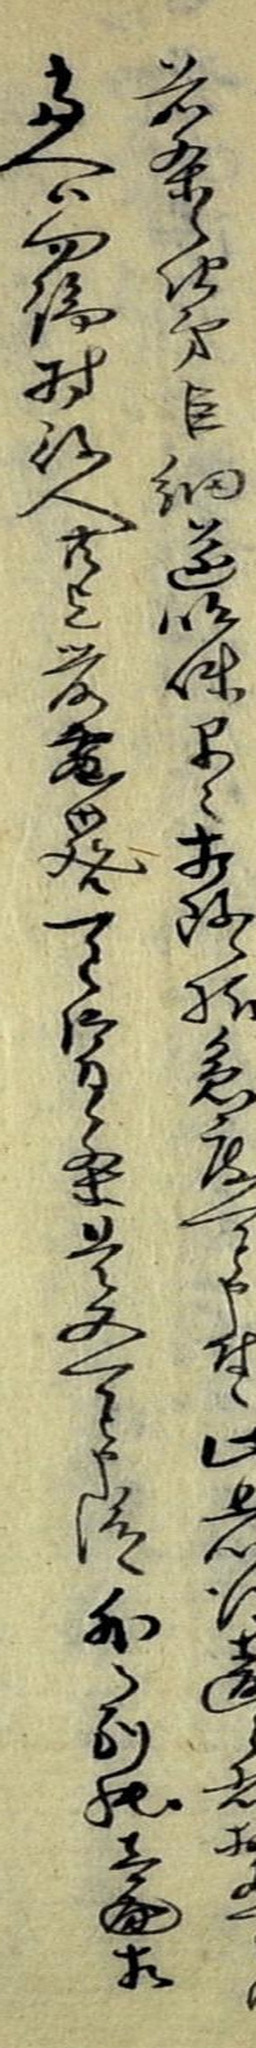当人は勿論村役人共迄厳敷御咎可被仰付候条且又可被申渡候外に別紙壱通相
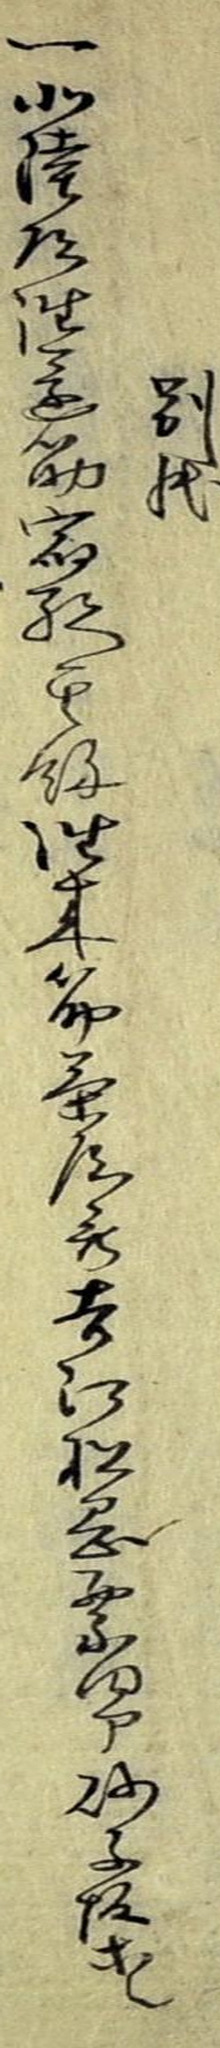一北陸道往還筋宿駅其餘往来筋茶屋并吉江松岡栗田部砂子坂等之
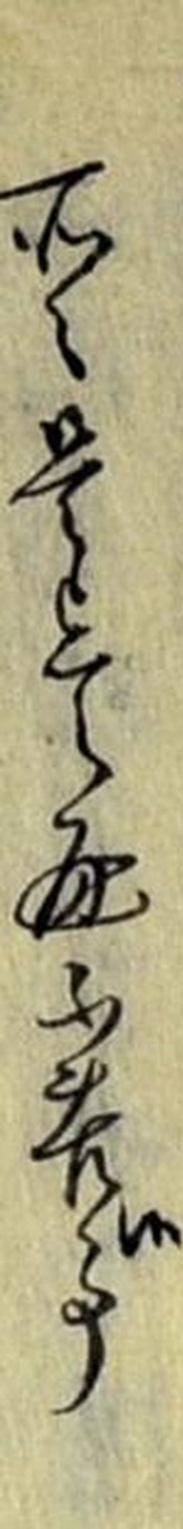所々是迄之通不苦候事
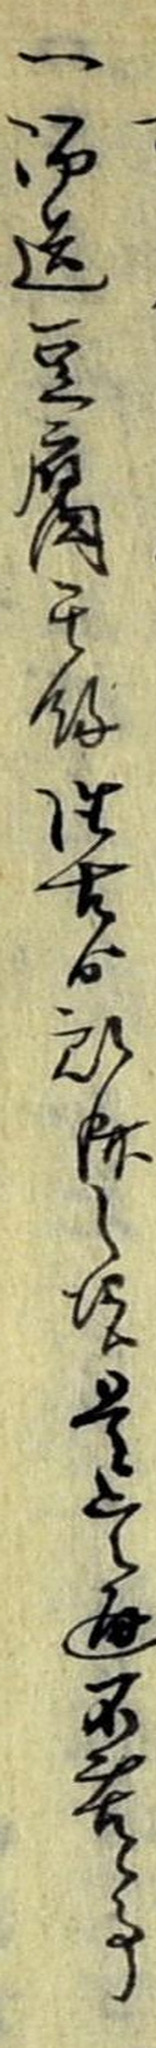一酒造豆腐其餘往古ゟ願済之儀は是迄之通不苦候事
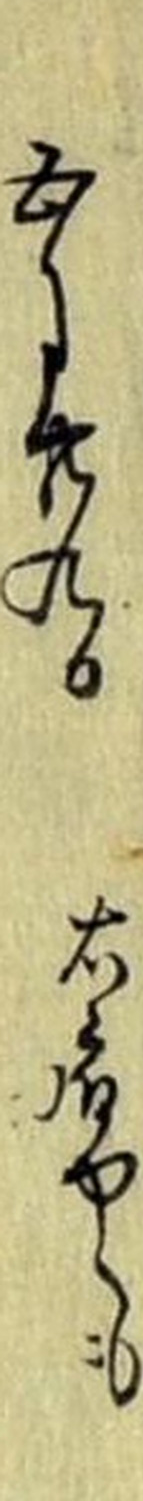五月廿九日右府中へも

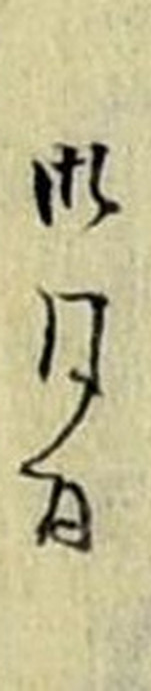御目付
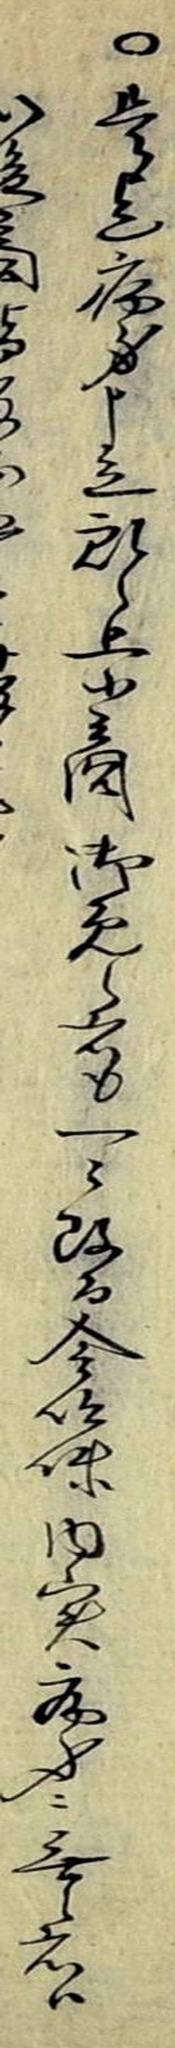○是迄病身申立願之上小商御免之者も一々改而令吟味内実病身に無之者は
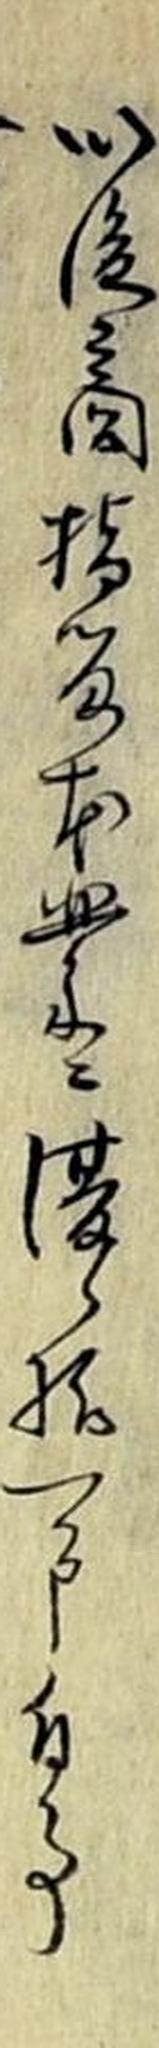以後商指留本業に復候様可申付事
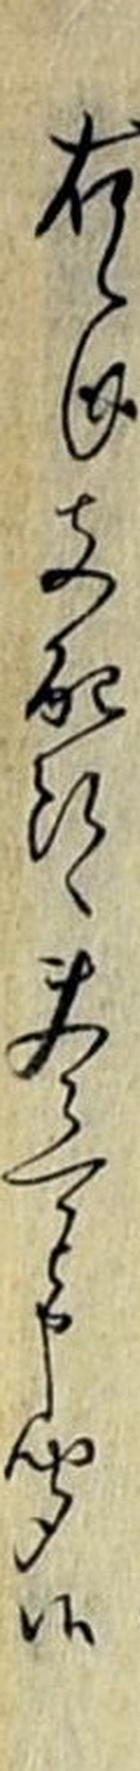右之趣支配頭へ夫々可被申聞候
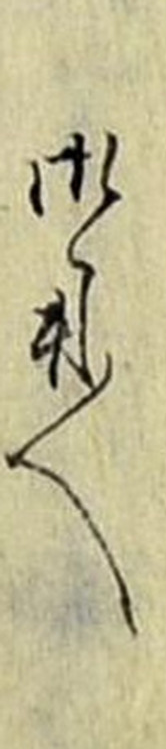御用人
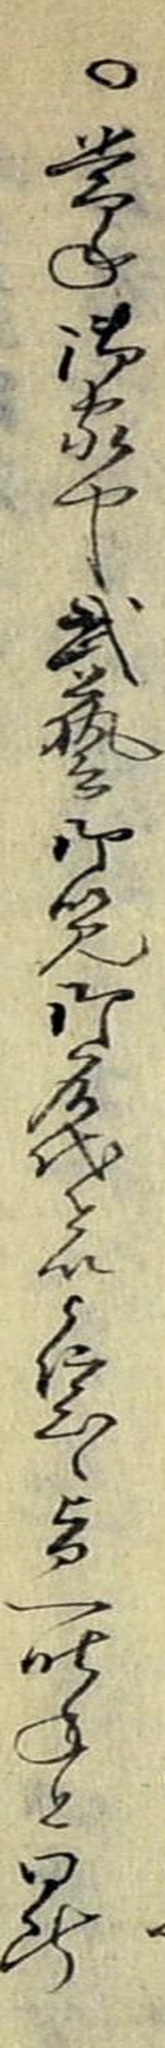○当年御家中武芸御覧御名代を以被仰出候旨一昨年と同断
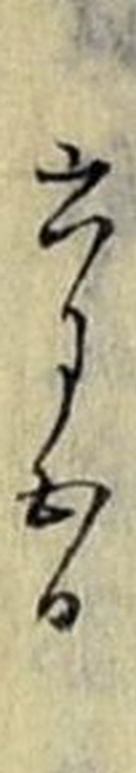六月五日
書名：命令之部 六
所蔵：福井県文書館 Fukui Prefectural Archives
